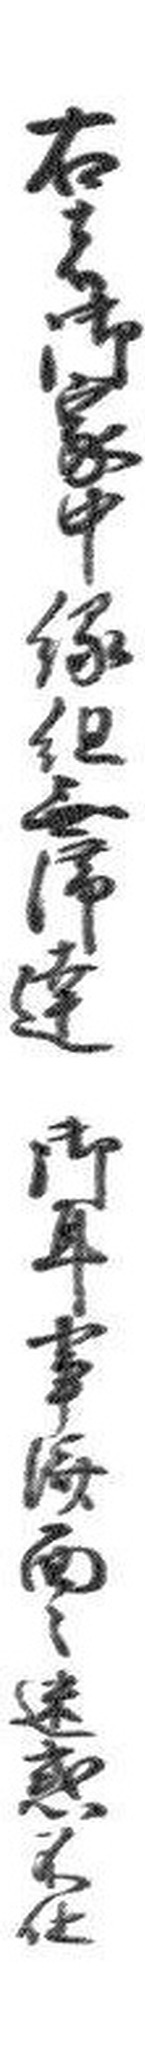右者御家中縁組無滞達御耳事済面々迷惑不仕
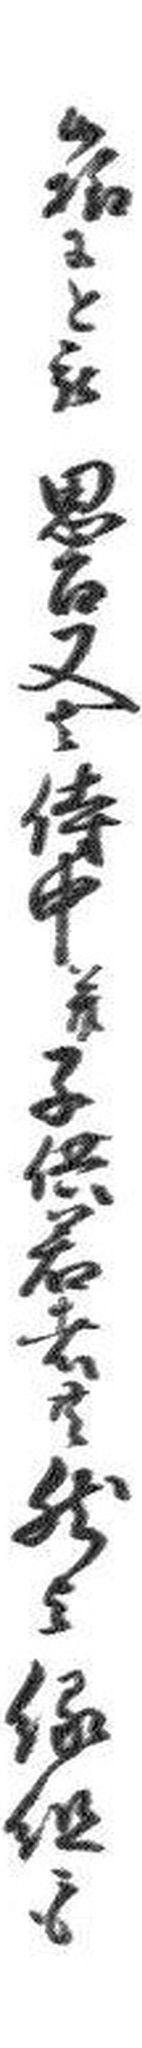候様にと被思召又者侍中并子供若者其然と縁組ニも
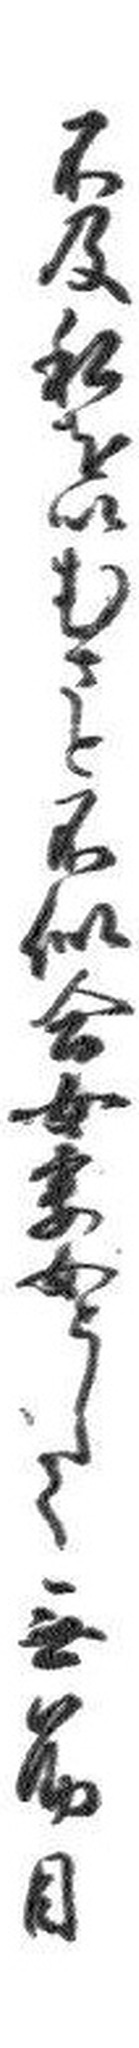不及私を以むさと不似合女妻女として無筋目
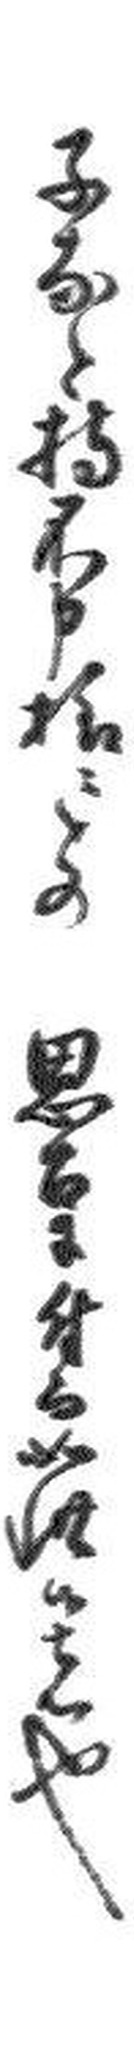子なと持不申様ニとの思召に付而如此候者也
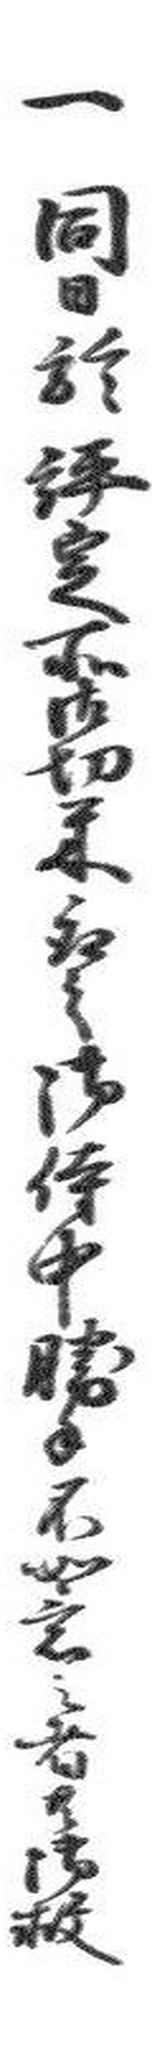一同日於評定所御切米取之御侍中勝手不如意之者共御救

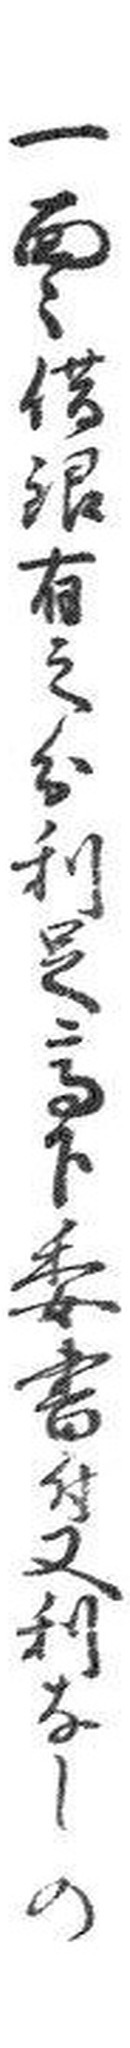一面々借銀有之分利足高下委書付又利なしの
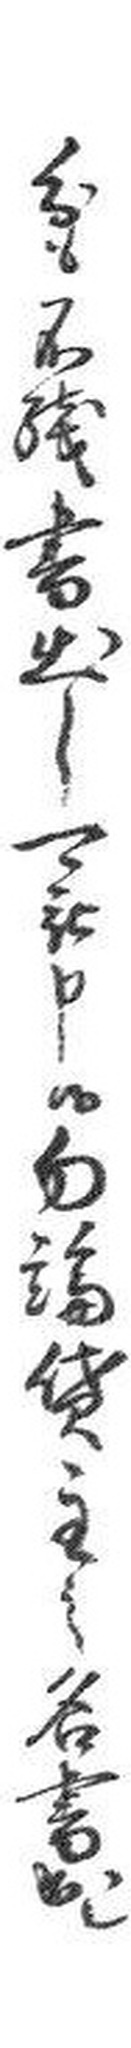分も不残書出し可被申候勿論貸主之名書出シ
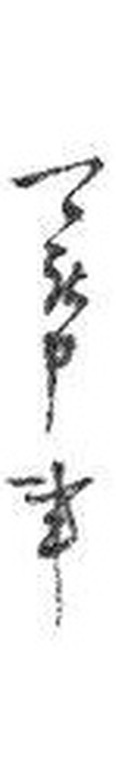可被申事
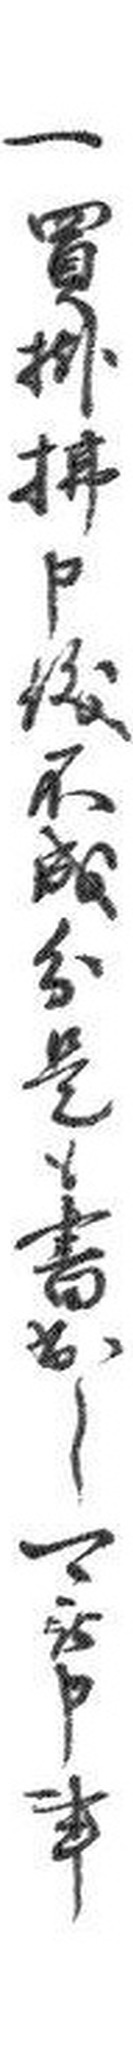一買掛払申儀不成分是も書出し可被申事
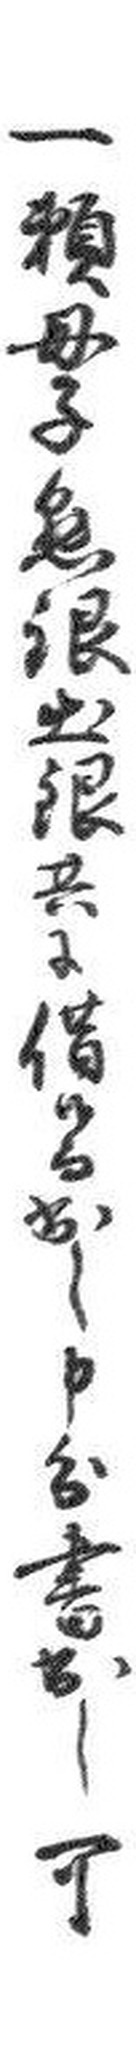一頼母子懸銀出銀共に借候而出し申分書出し可
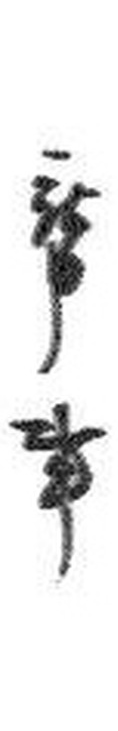被申事
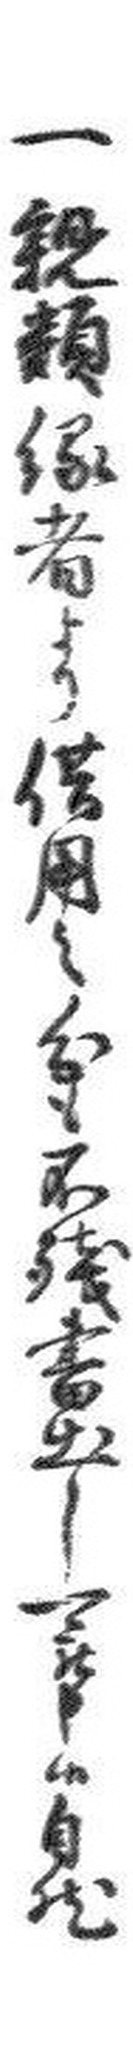一親類縁者より借用之分も不残書出し可被申候自然
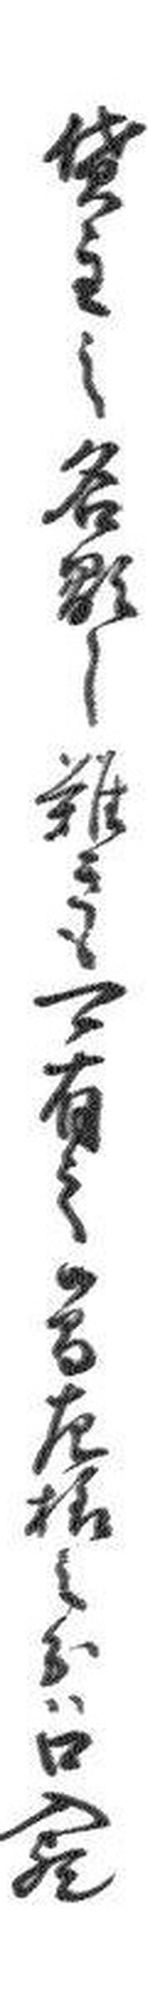貸主之名顕し難きも可有之候間左様之分ハ口入歟
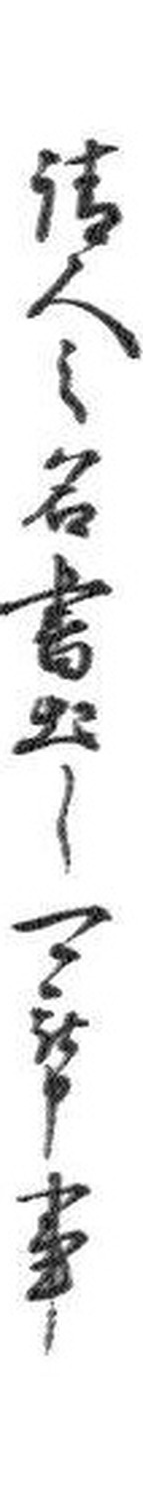請人之名書出し可被申事
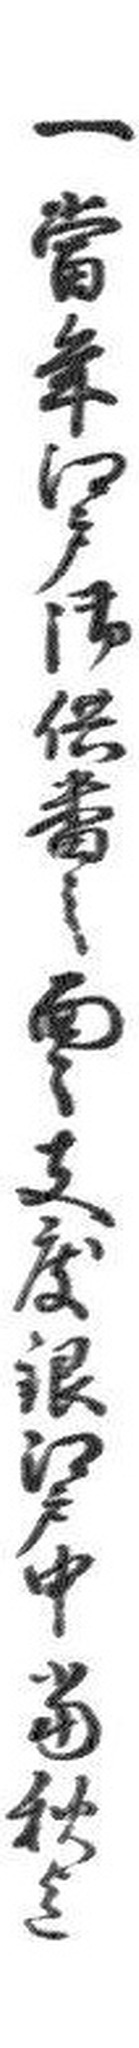一当年江戸御供番之面々支度銀江戸中当秋迄
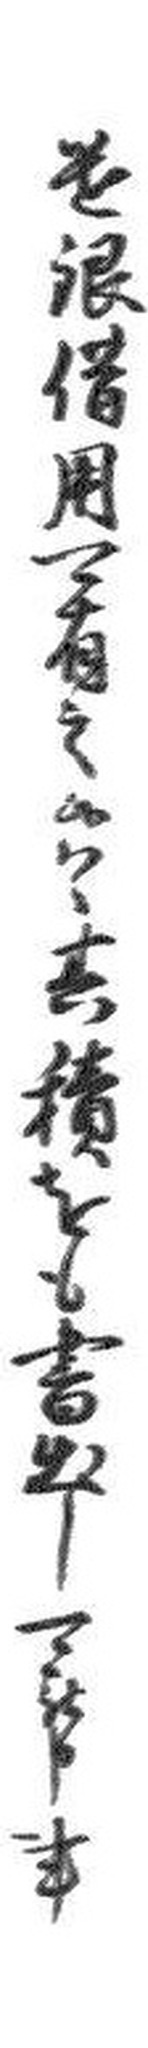遣銀借用可有之候ハヽ其積をも書出し可被申事
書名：家譜 八 光通公 従寛文十年到同十二年
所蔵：福井県文書館 Fukui Prefectural Archives
